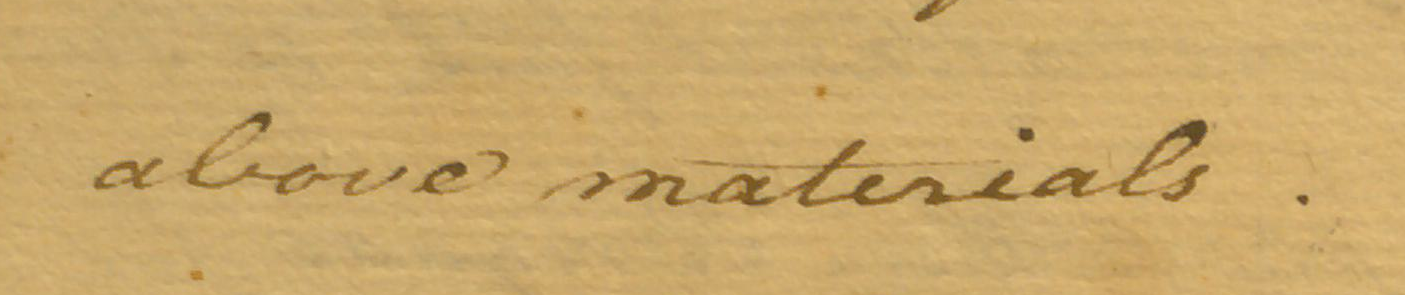above materials.
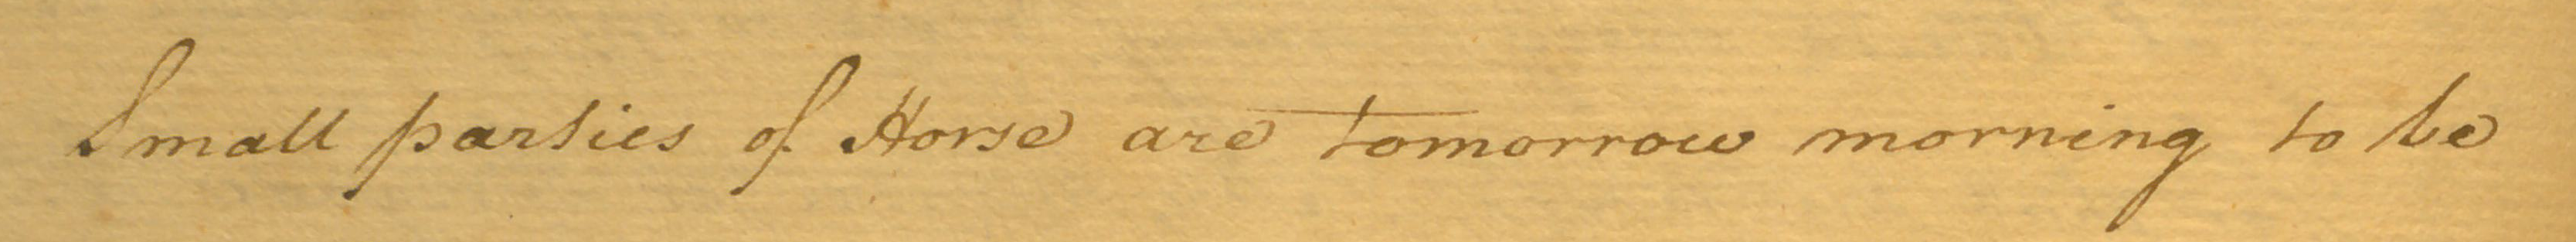Small parties of Horse are tomorrow morning to be
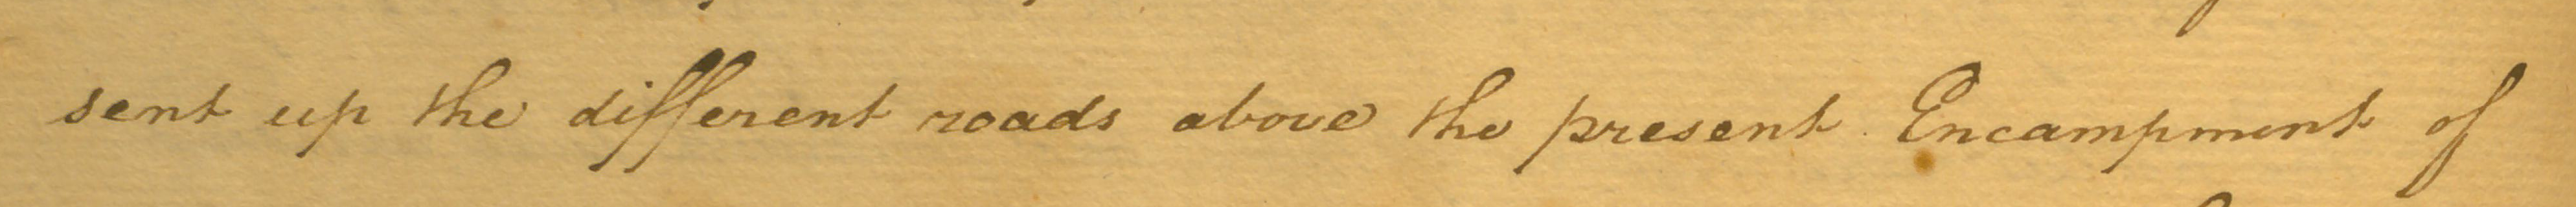sent up the different roads above the present Encampment of
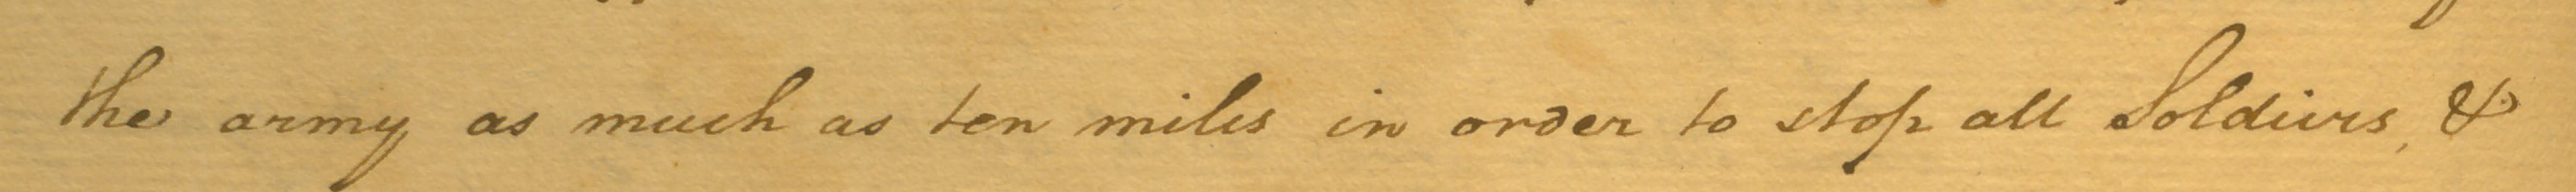the army as much as ten miles in order to stop all Soldiers &
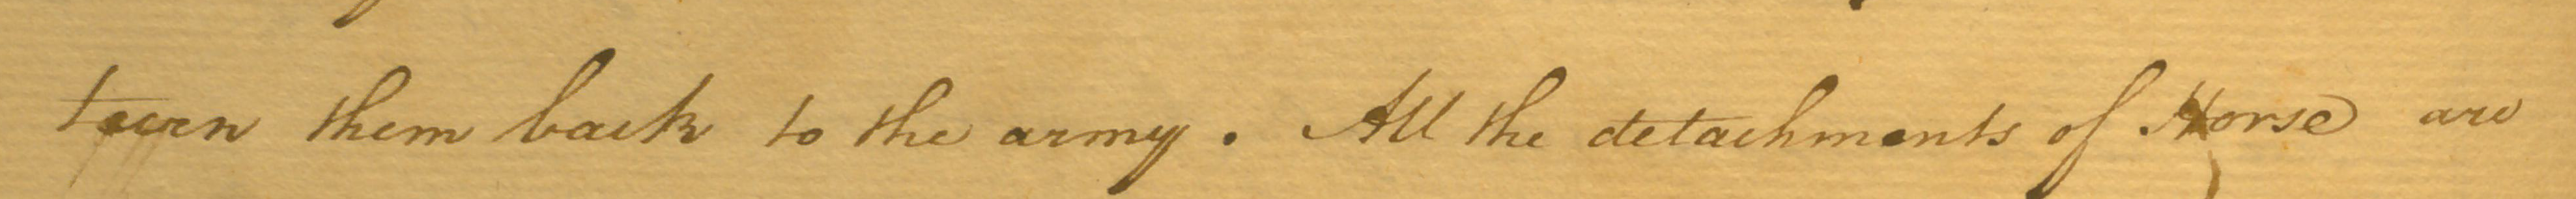turn them back to the army. All the detachments of Horse are
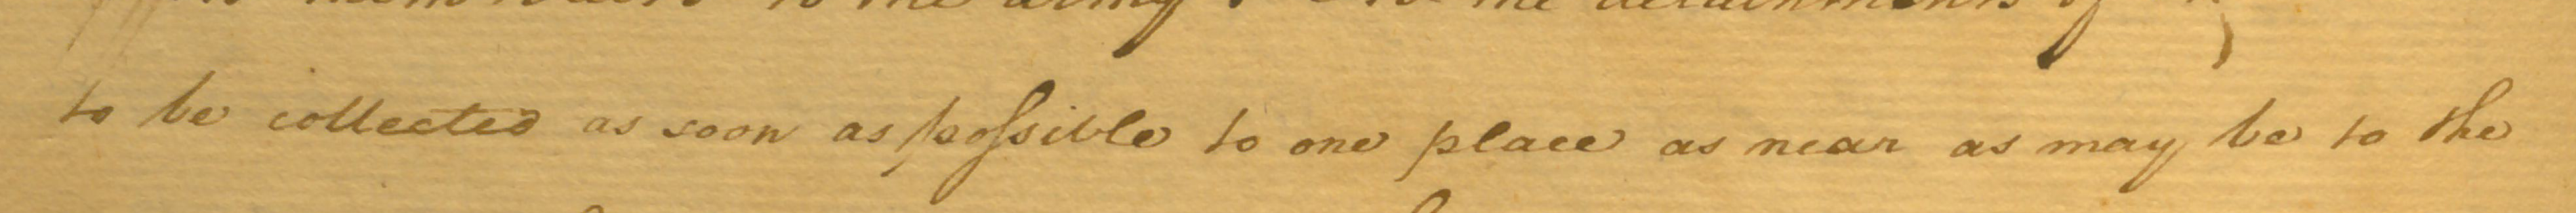to be collected as soon as possible to one place as near as may be to the
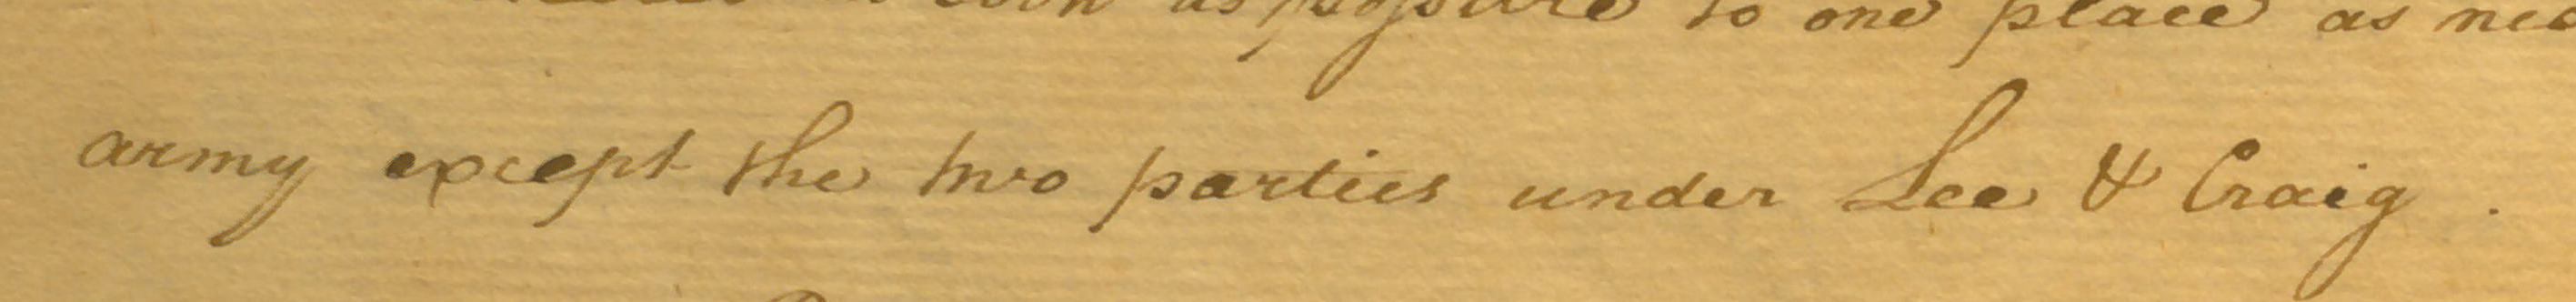army except the two parties under Lee & Craig.
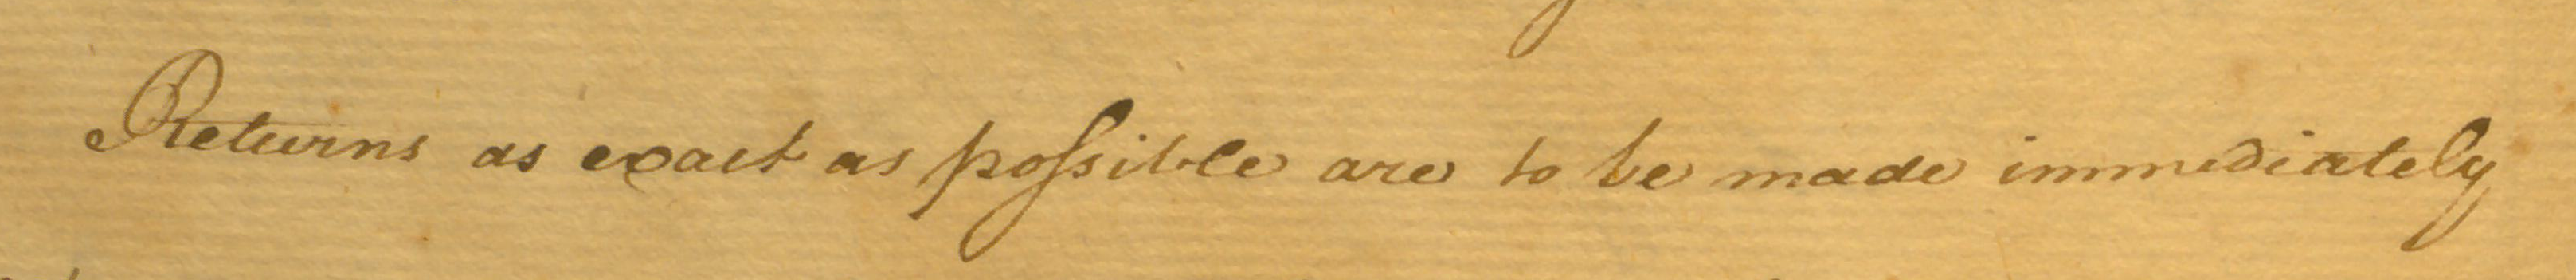Returns as exact as possible are to be made immediately
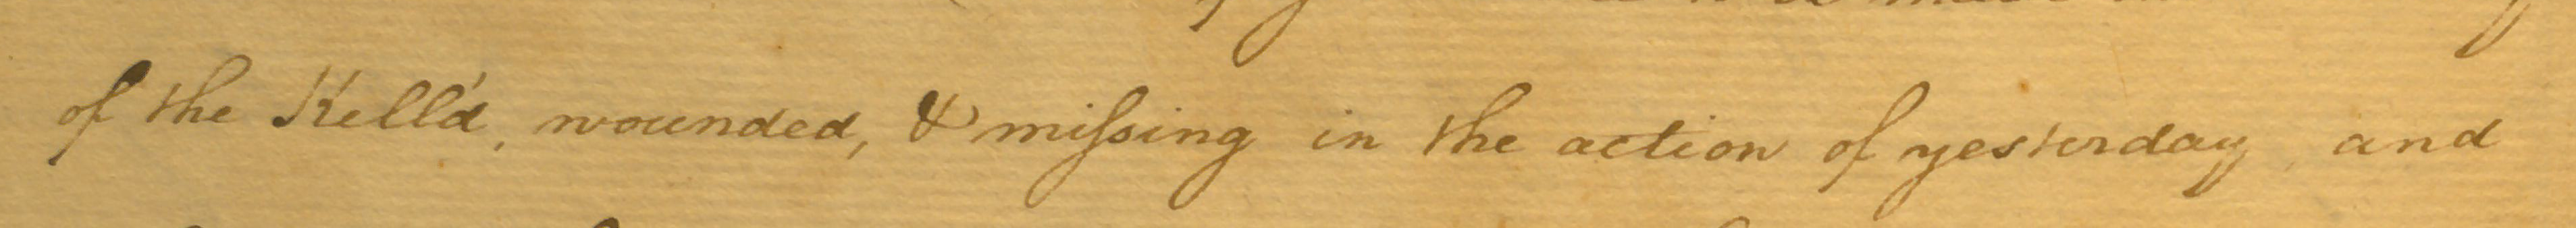of the Kill'd, wounded, & missing in the action of yesterday and
